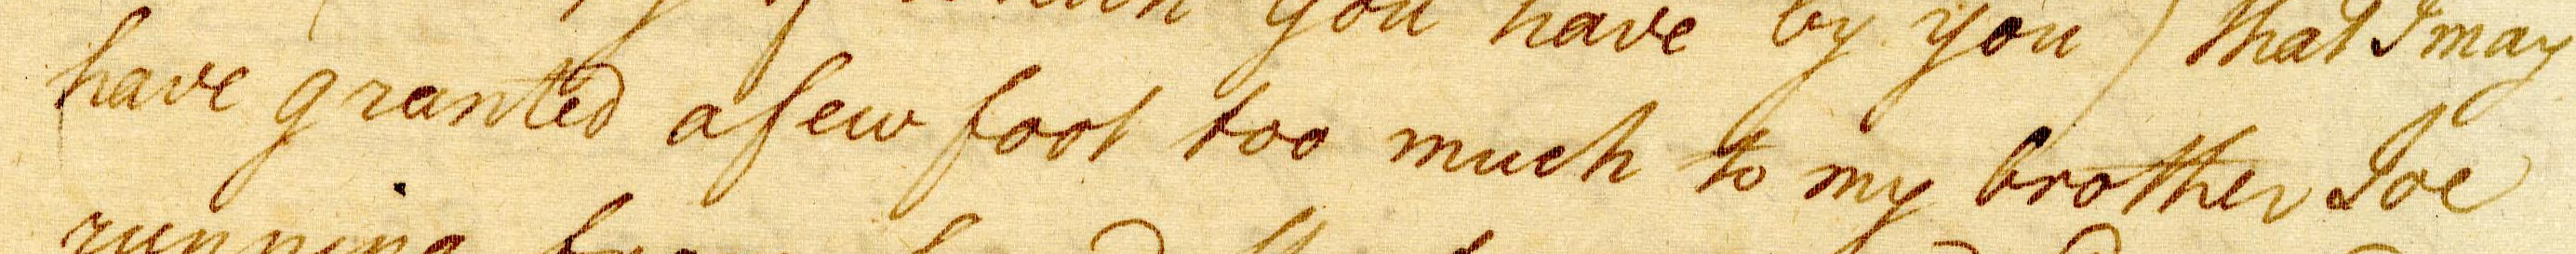have granted a few foot too much to my brother Joe
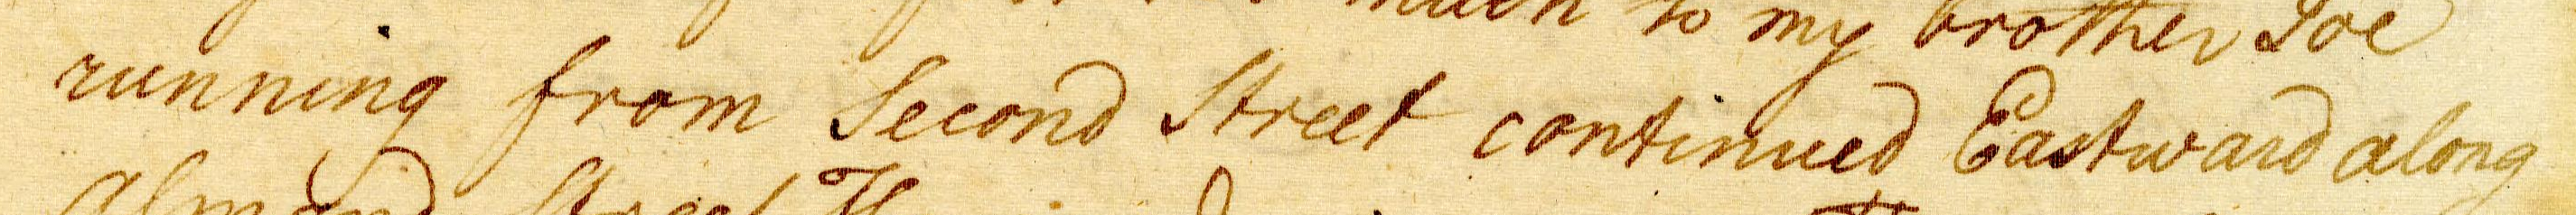running from Second Street continued Eastward along
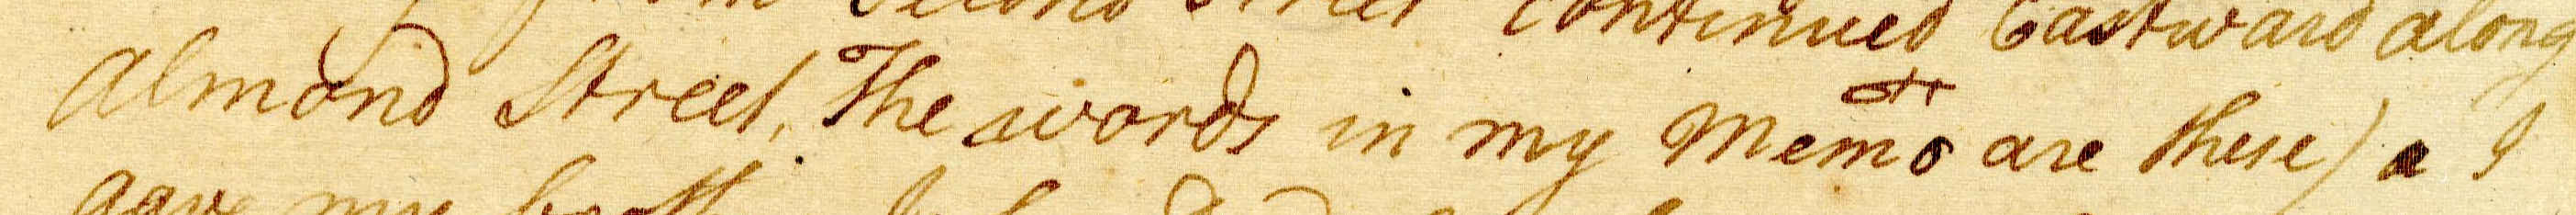Almond Street, The awards in my Memo are these) I
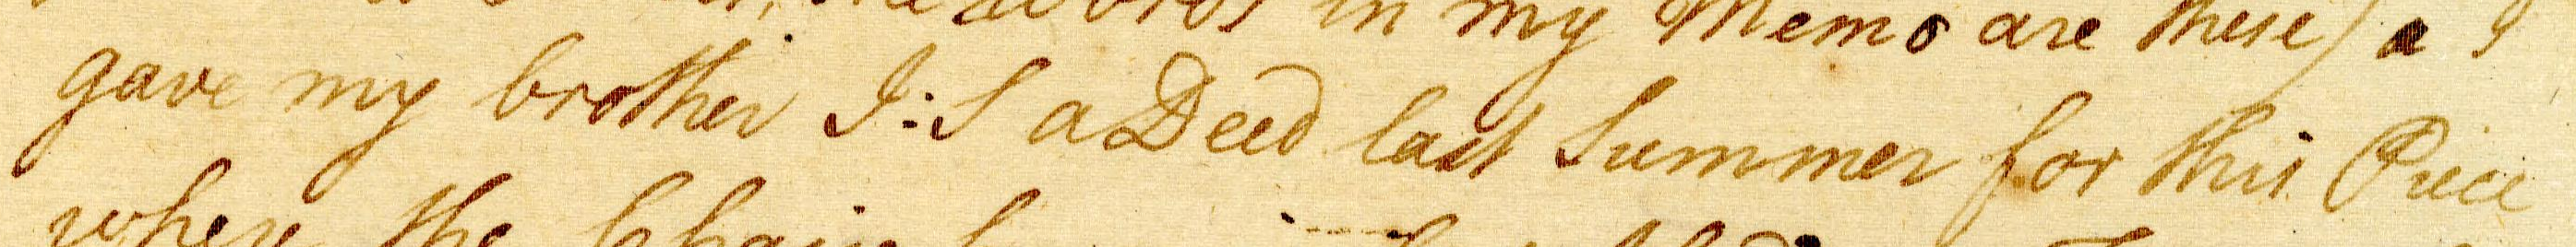gave my brother J:S a Deed last Summer for this Piece
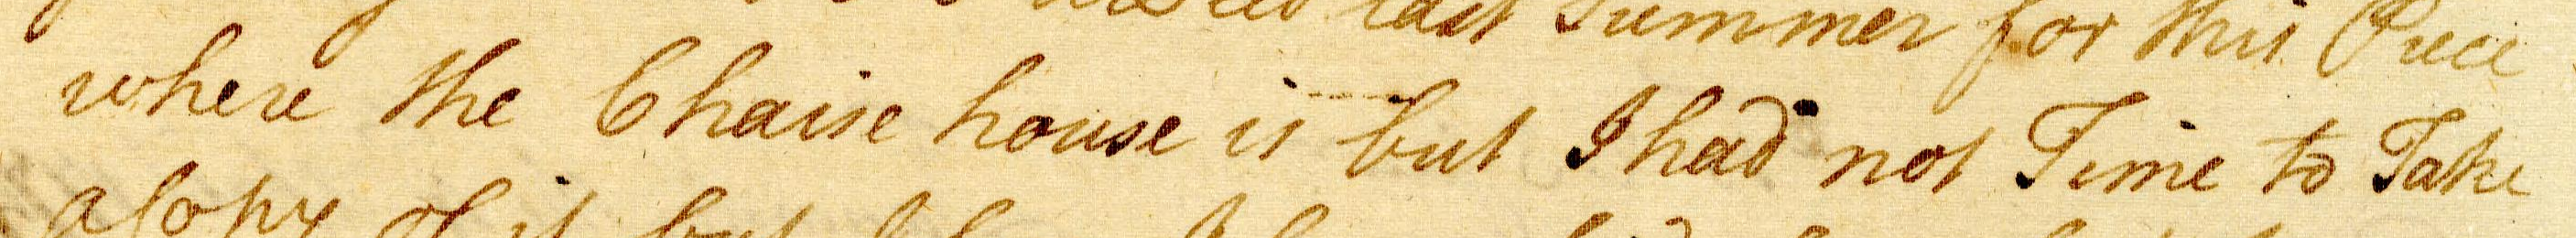where the Chaise house is but I had not Time to Take
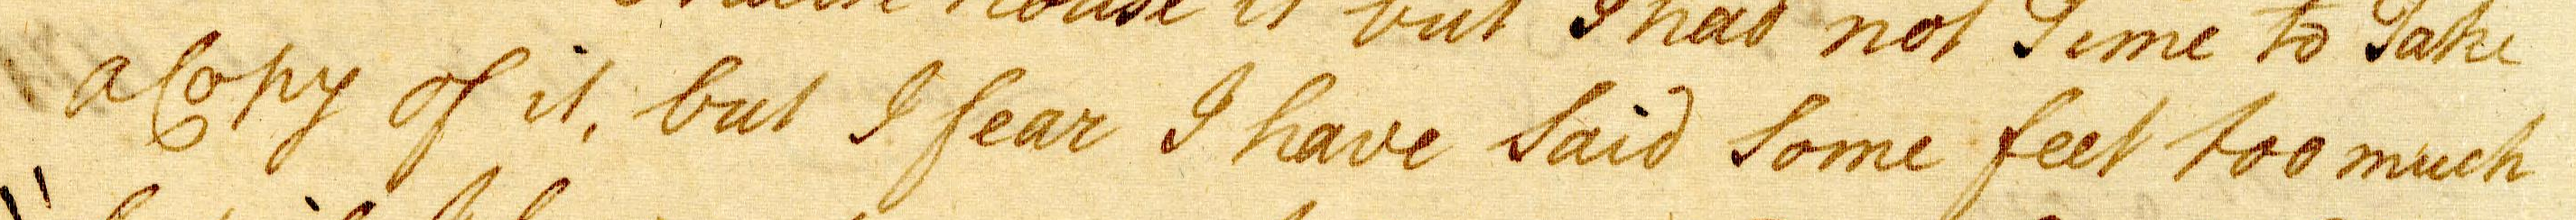a Copy of it, but I fear I have said some feet too much
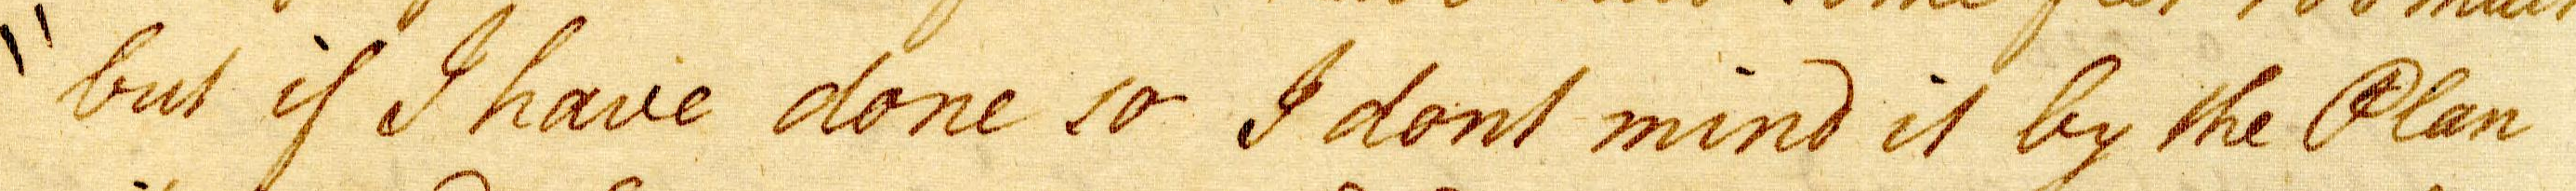"but if I have done so I dont mind it by the Plan
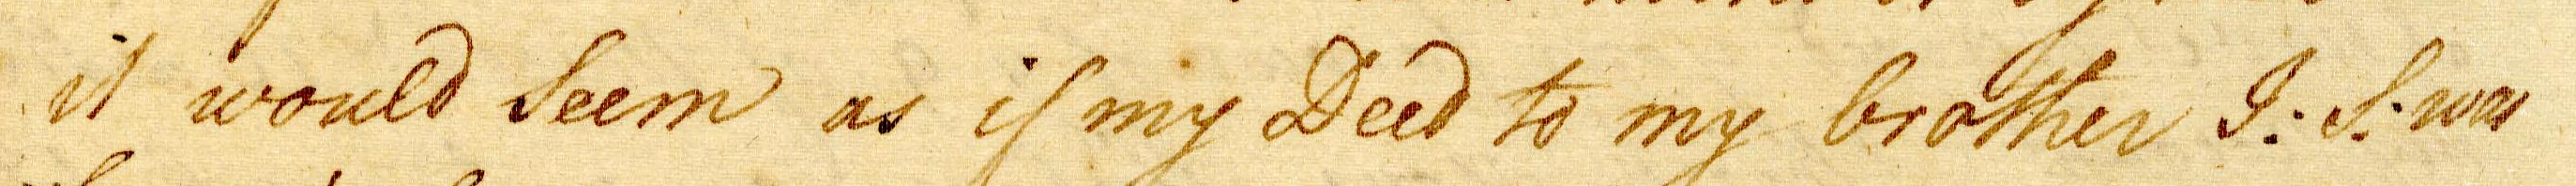it would seem as if my Deed to my brother J: S: was
